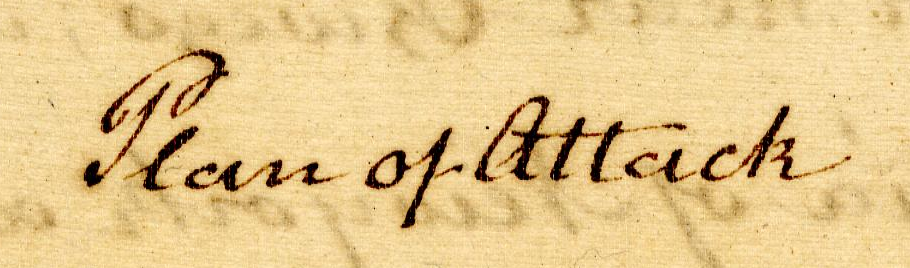Plan of Attack
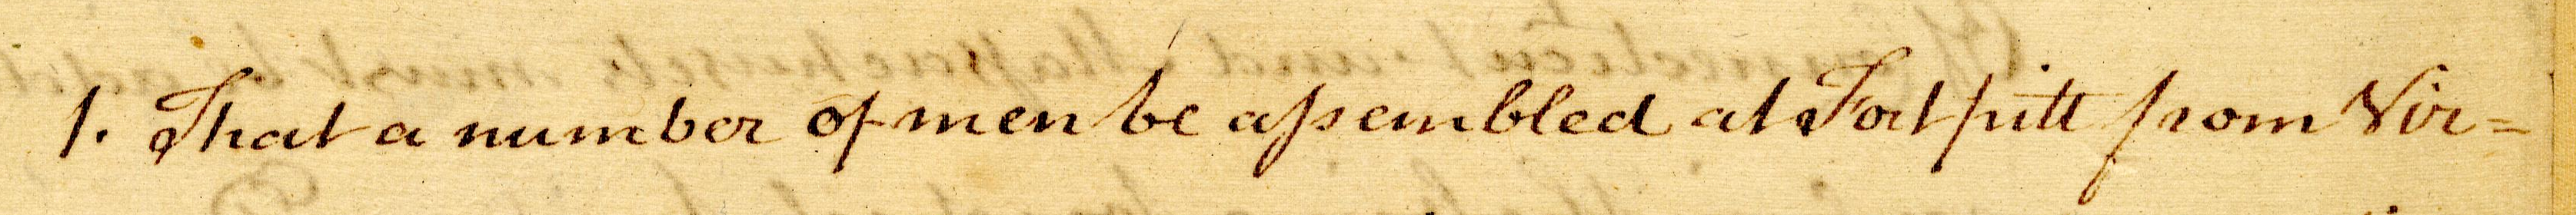1. That a number of men be assembled at Fortpitt from Vir-
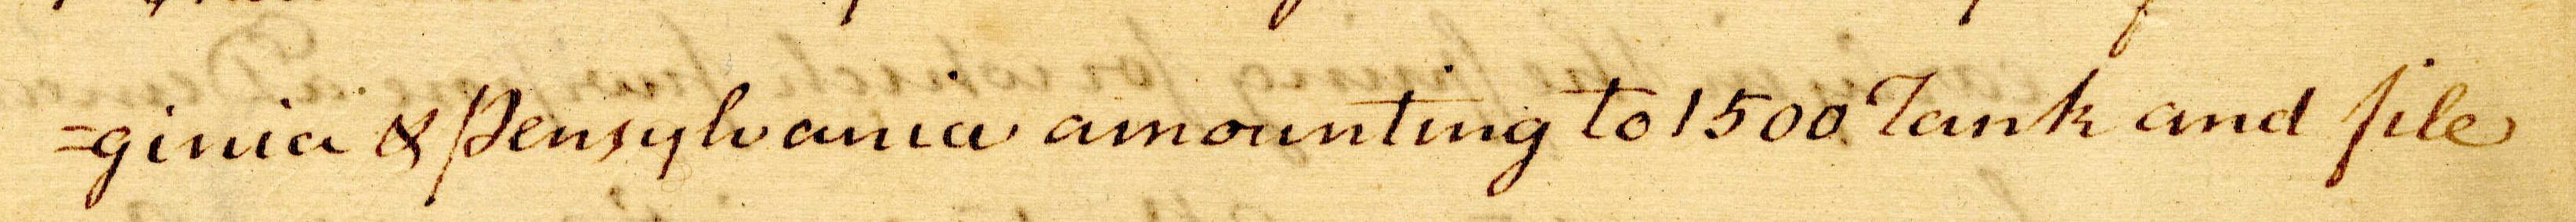-ginia & Pennsylvania amounting to 1500 rank and file
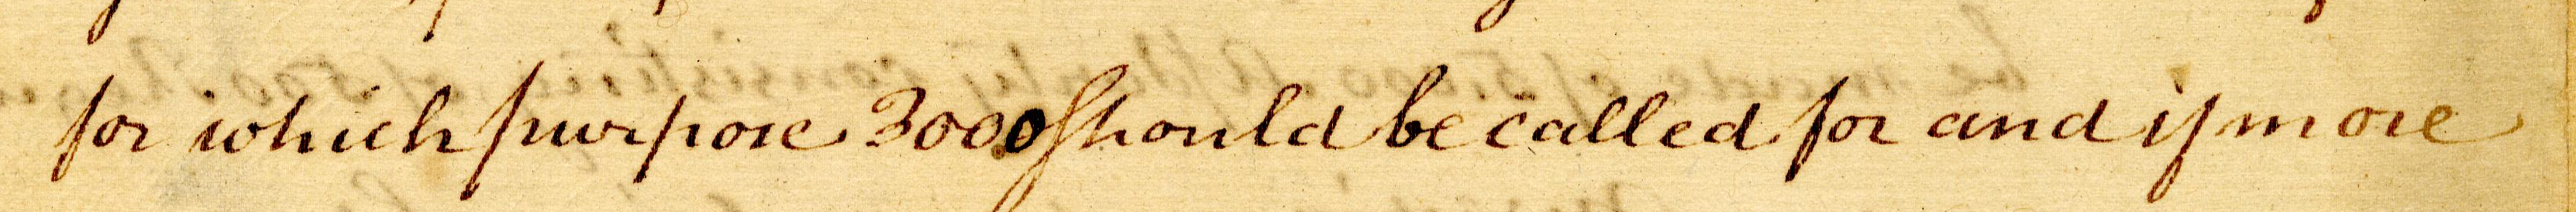for which purpose 3000 should be called for and if more
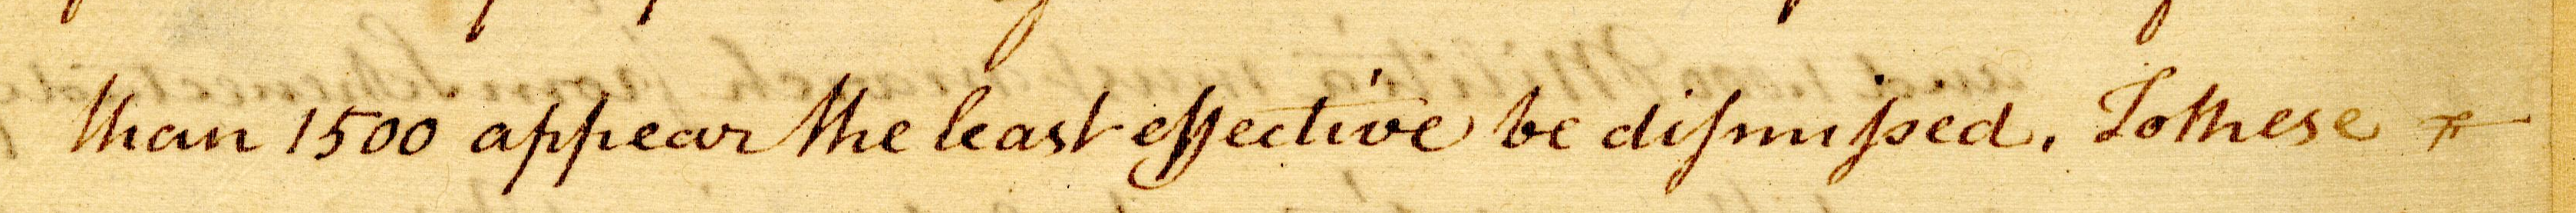than 1500 appear the least effective be dismissed, To these
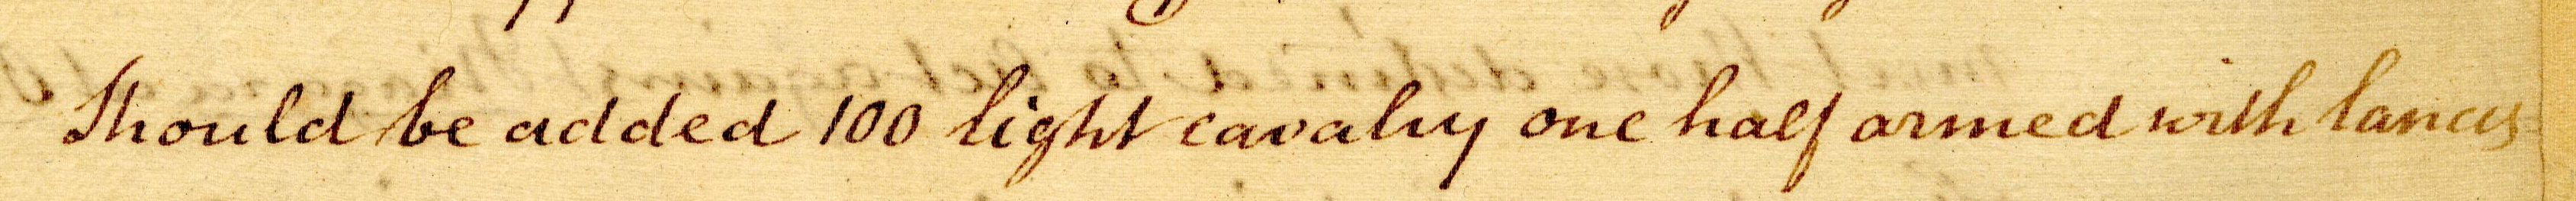should be added 100 light cavalry one half armed with lances
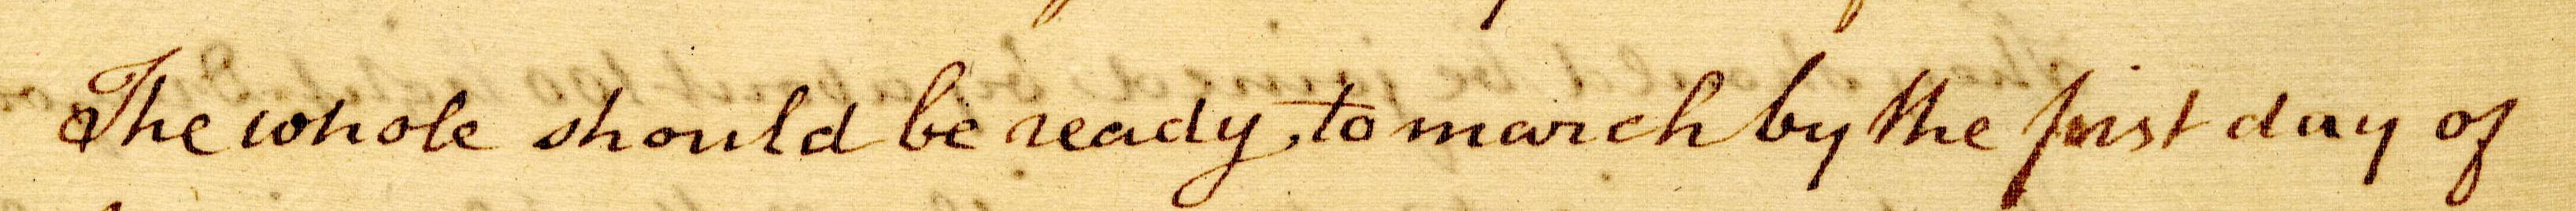The whole should be ready to march by the first day of
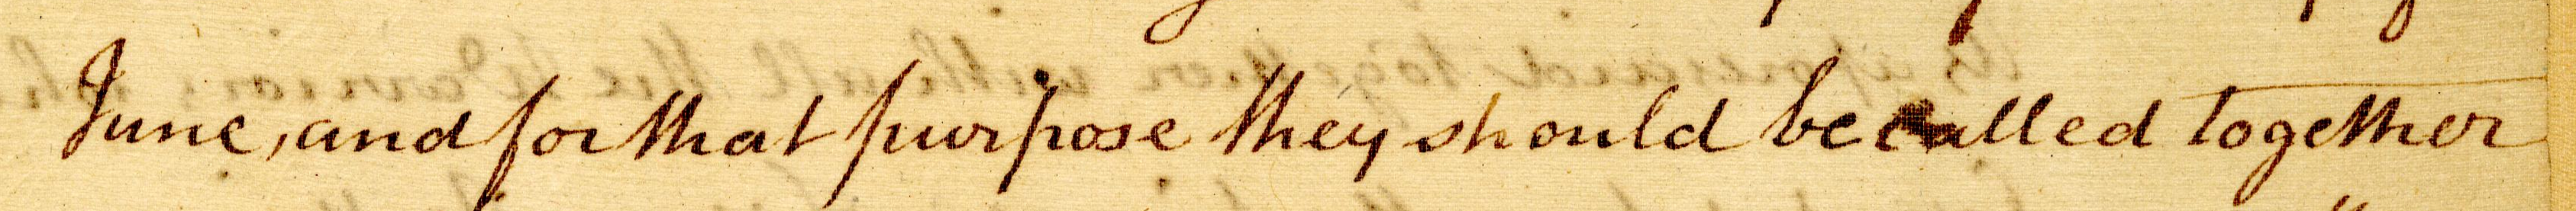June, and for that purpose they should be called together
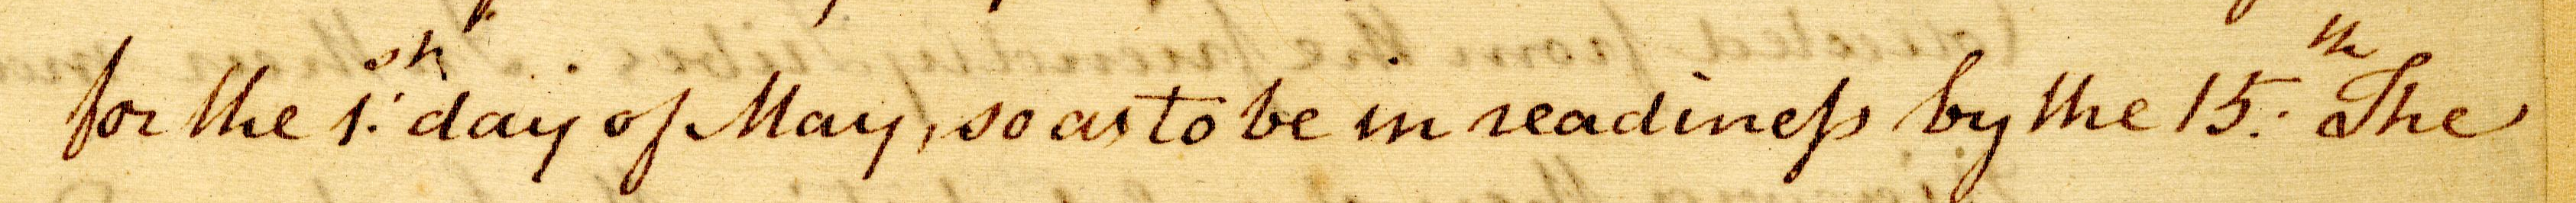for the 1^st: day of May, so as to be in readiness by the 15^th: The
